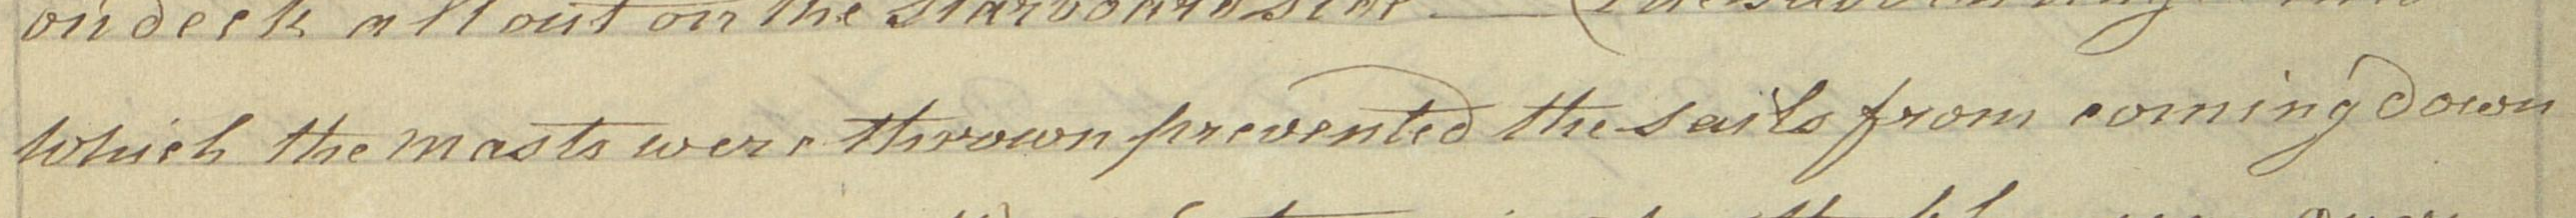which the masts were thrown prevented the sails from coming down
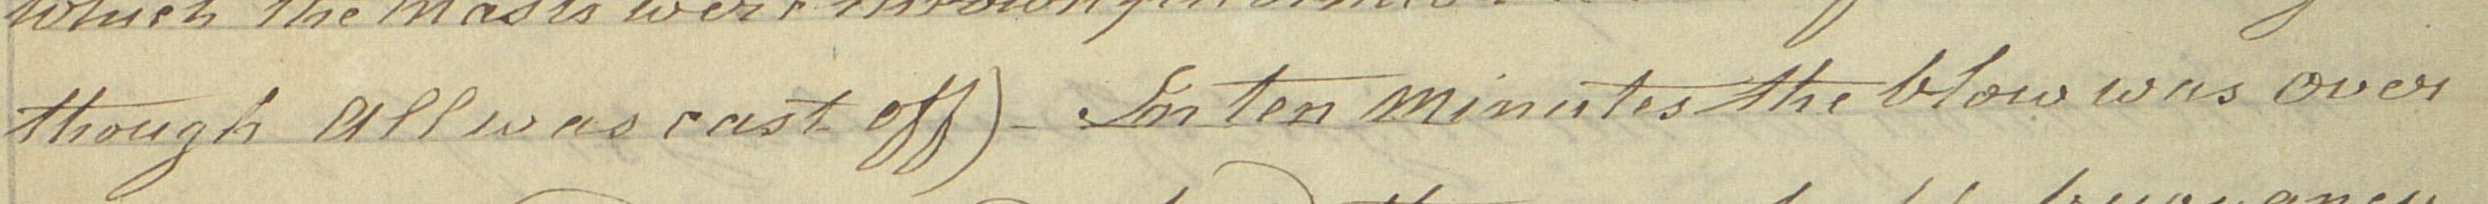though All was cast off) In ten minutes the blow was over
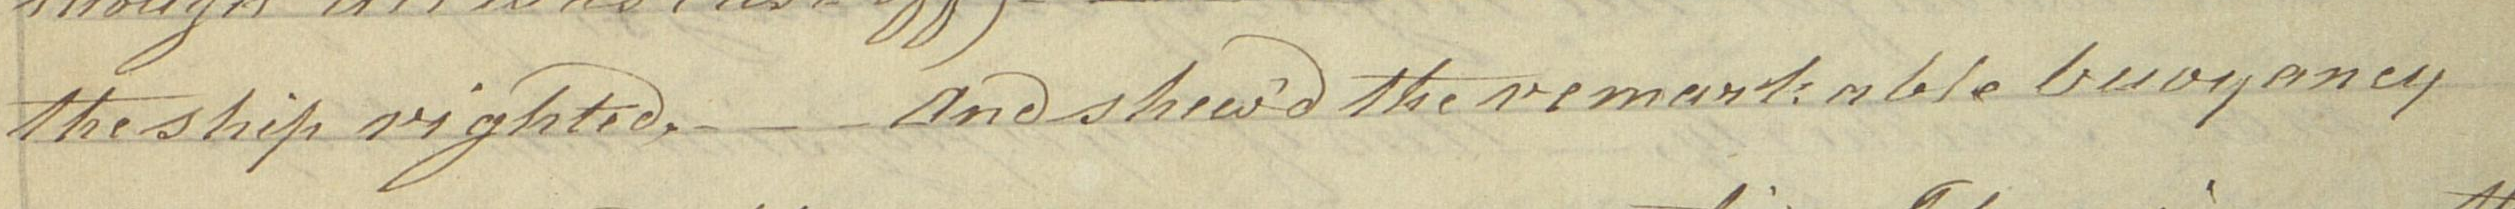the ship righted. And shew'd the remarkable buoyancy
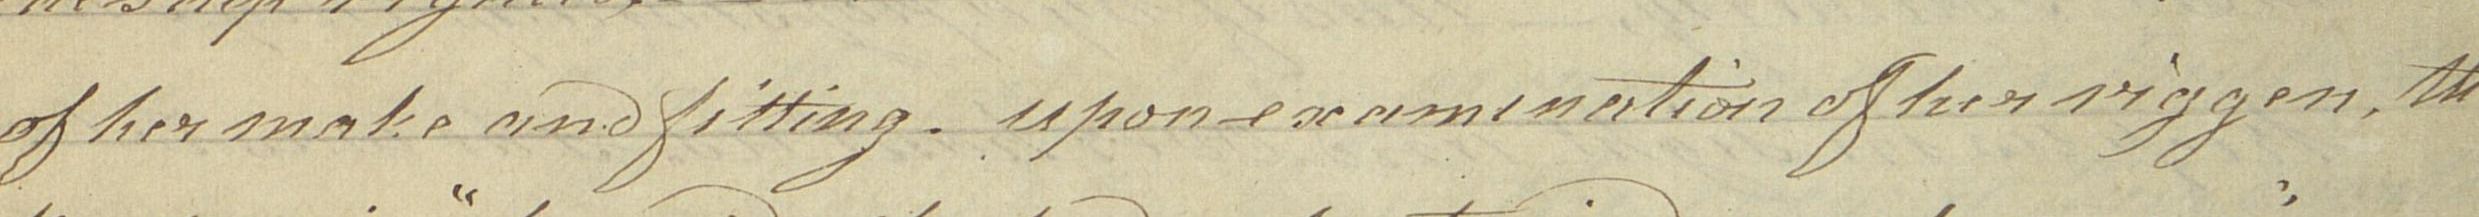of her make and fitting. upon examination of her riggen, the
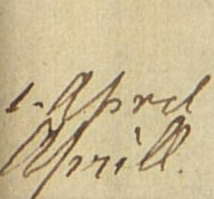1. April
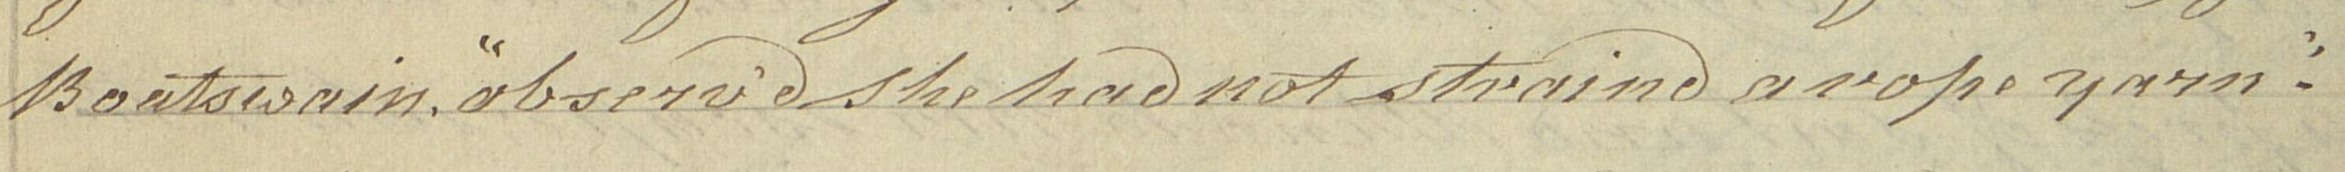Boatswain "observ'd she had not straind a rope yarn"
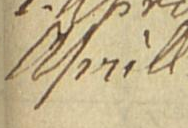Aprill
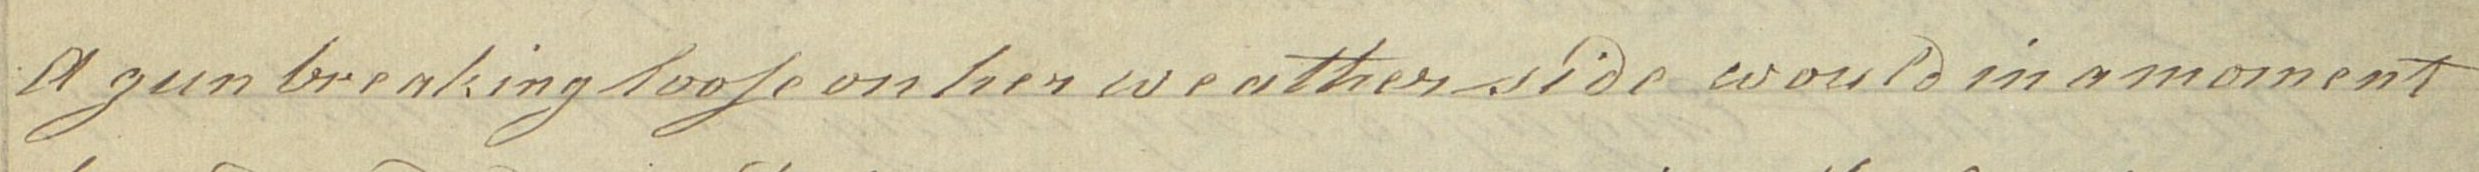A gun breaking loose on her weather side would in a moment
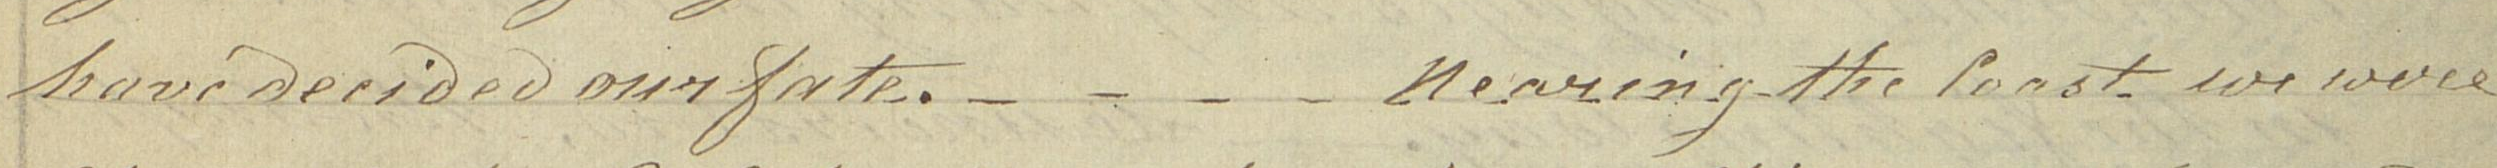have decided our fate. Hearing the Coast we were
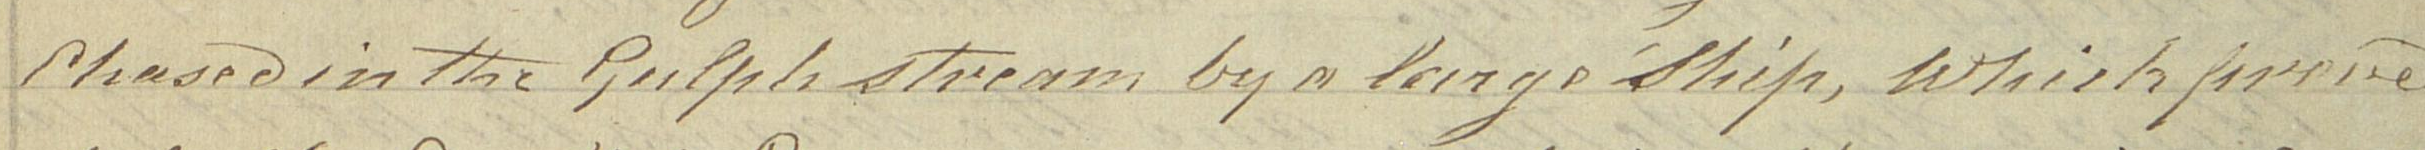Chased is the Gulph stream by a large Ship, which proved
